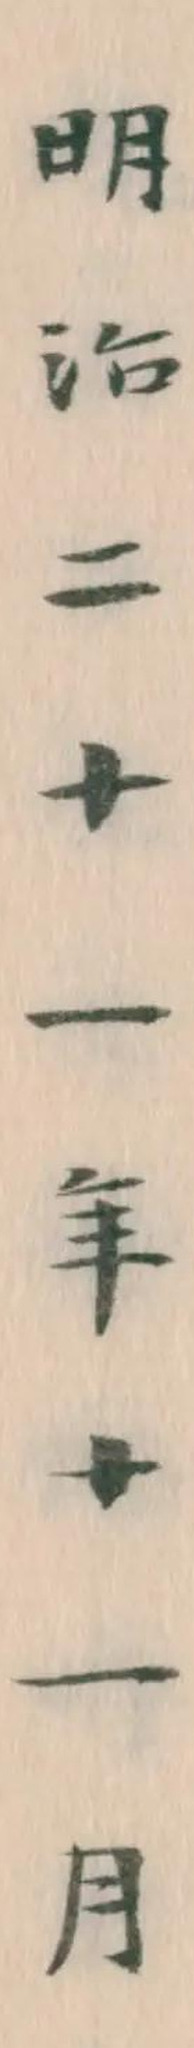明治二十一年十一月
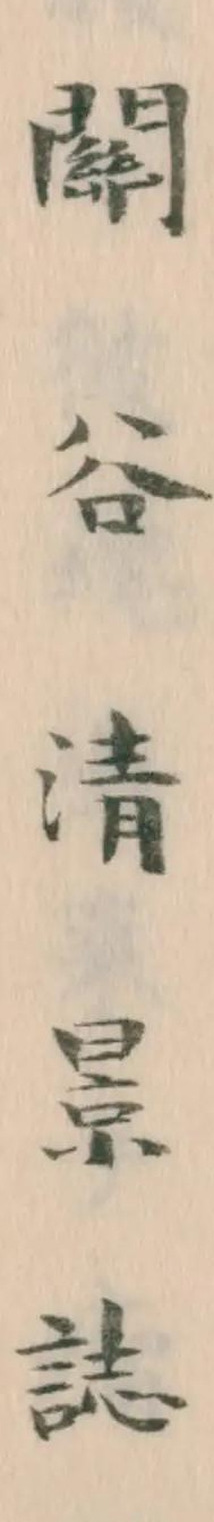関谷清景誌

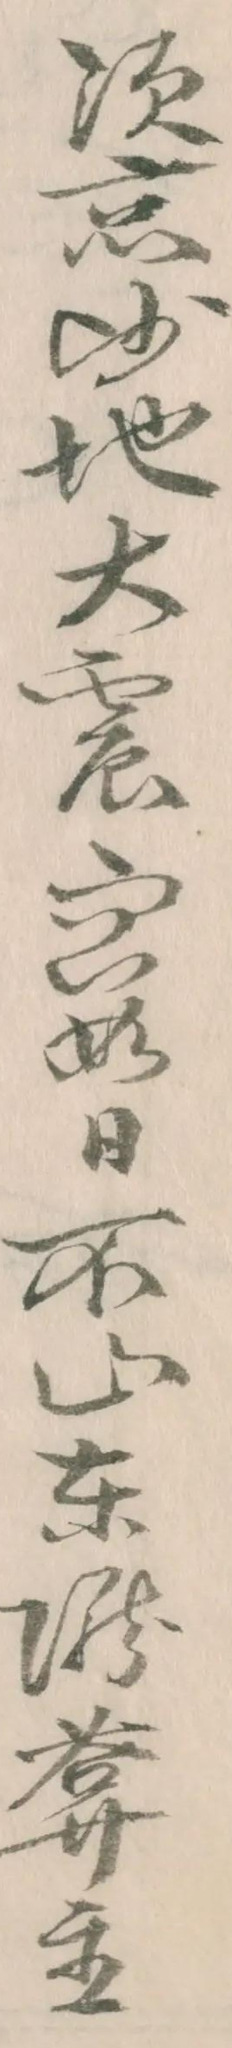頃京師地大震而数日不止東隴庵主
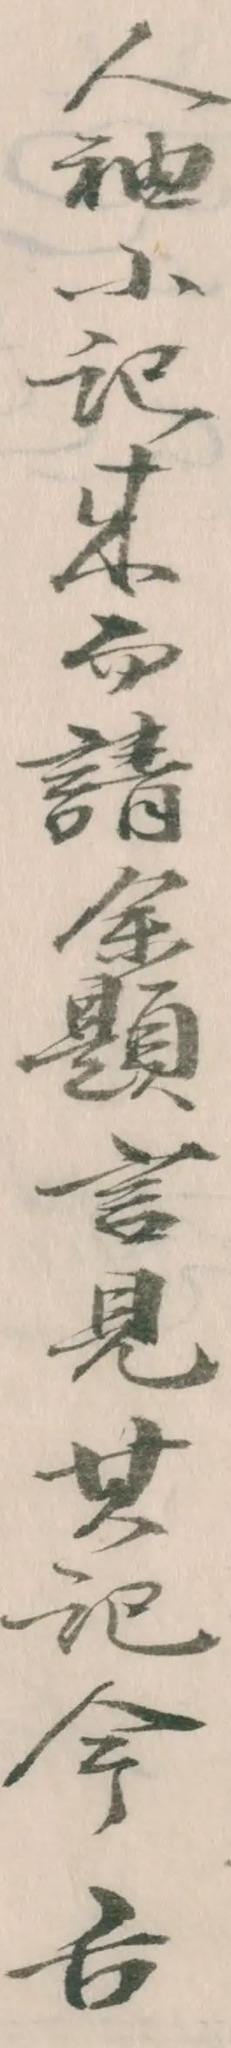人袖小記来而請余題言見其記今右
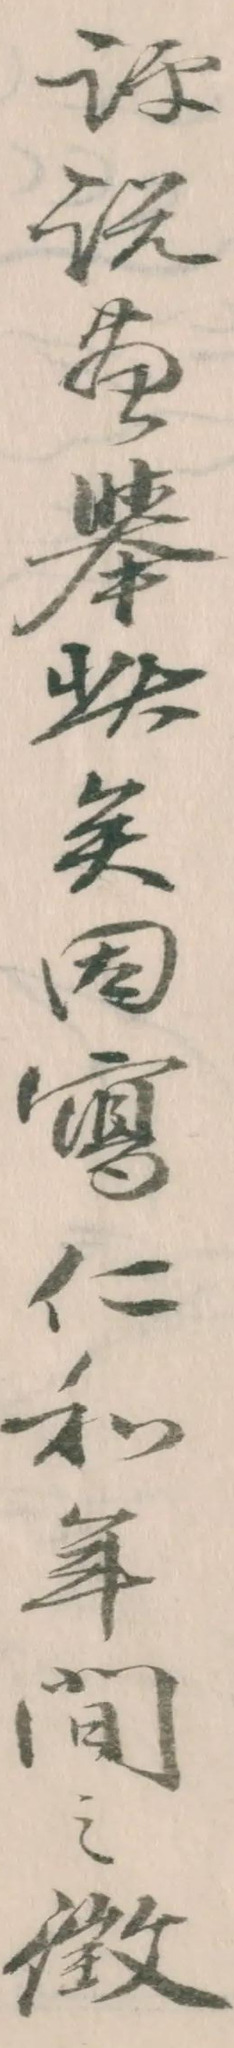評説画挙此矣因写仁和年間之徴
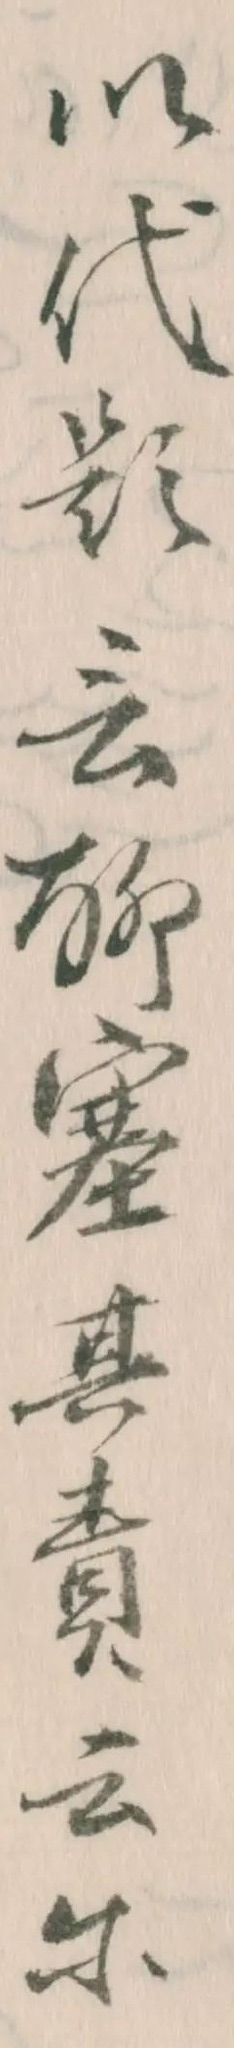以代題言聊塞其責云爾
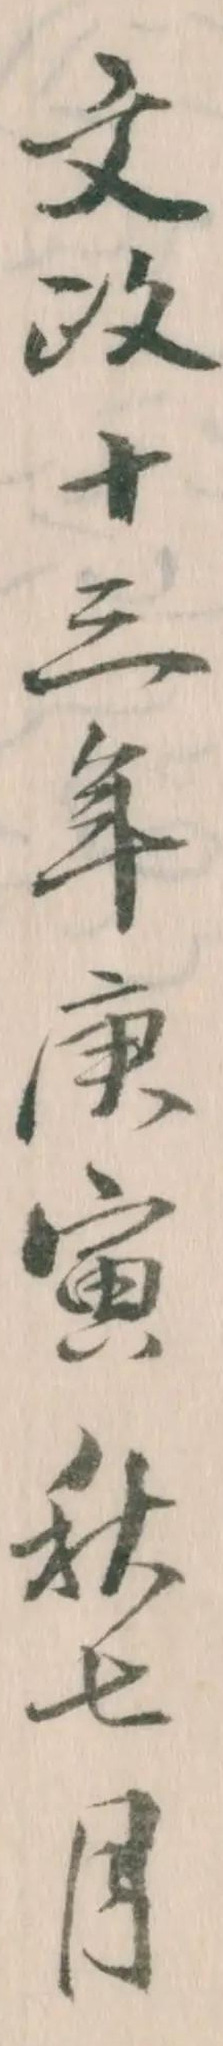文政十三年庚寅秋七月
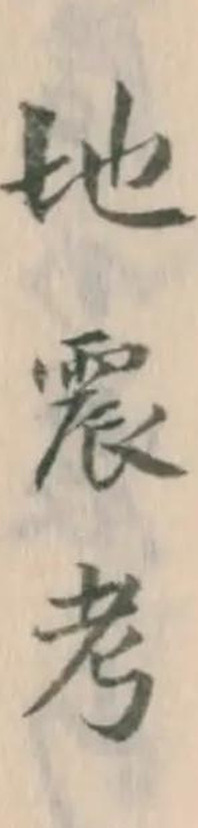地震考
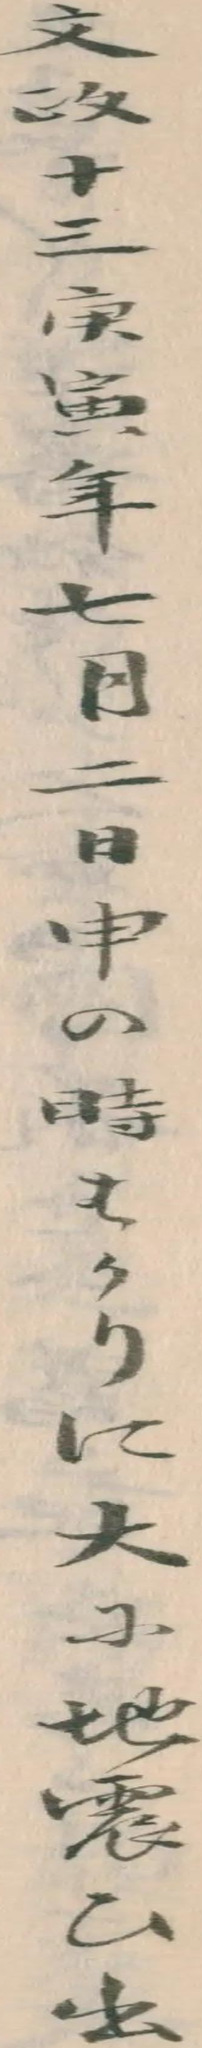文政十三庚寅年七月二日申の時はかりに大に地震ひ出
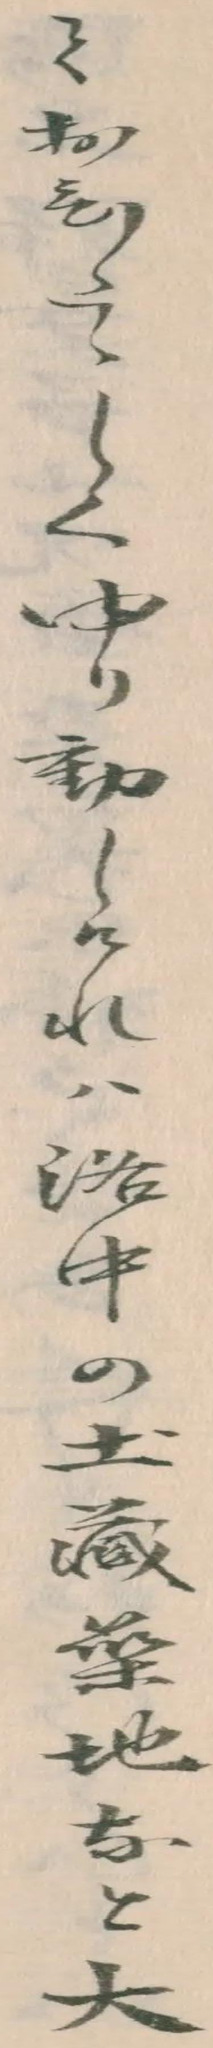ておひたゝしくゆり動しけれは洛中の土蔵築地など大
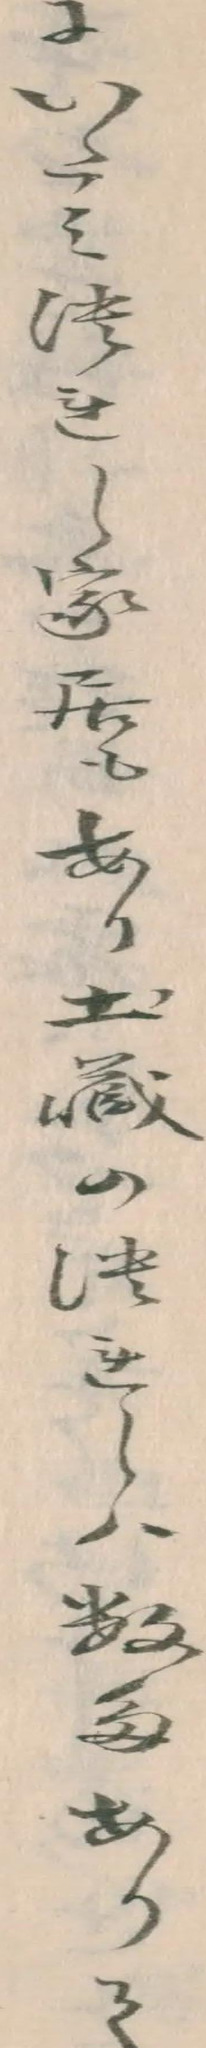にいたみ潰れし家居もあり土蔵の潰れしは数多ありて
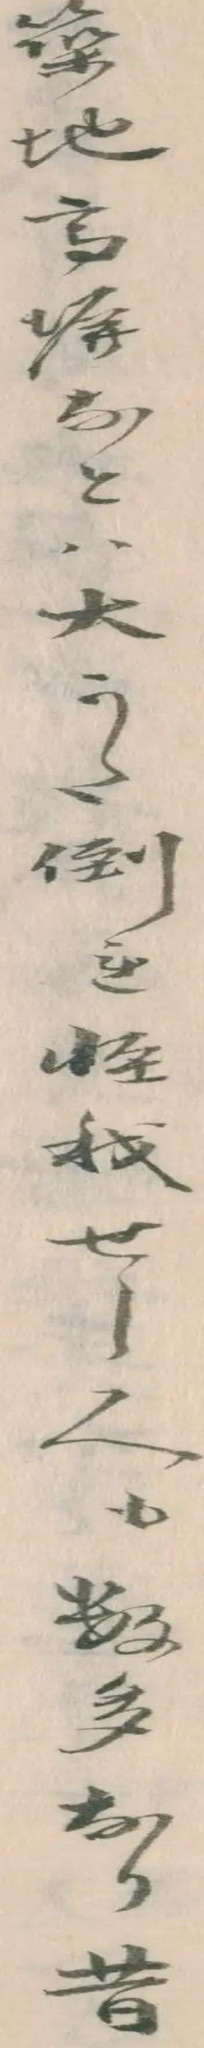築地高塀なとは大かた倒れ怪我せし人も数多なり昔
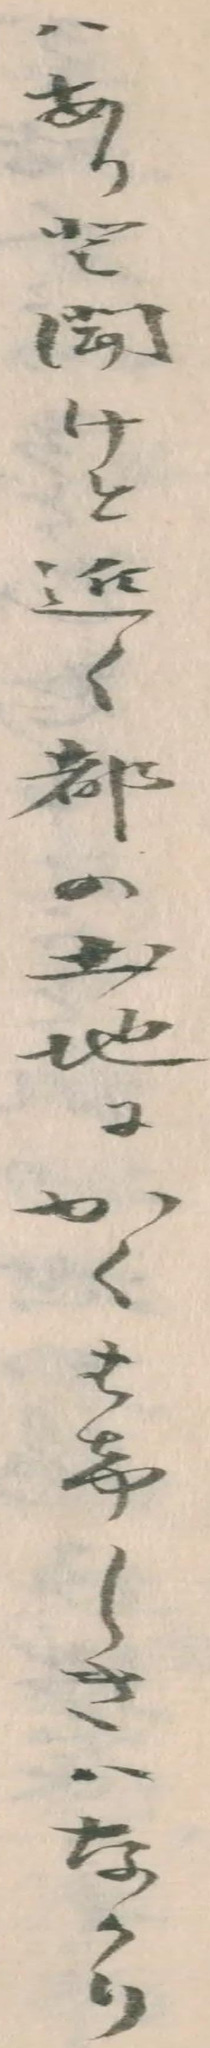はありと聞けと近く都の土地にかくはけしきはなかり
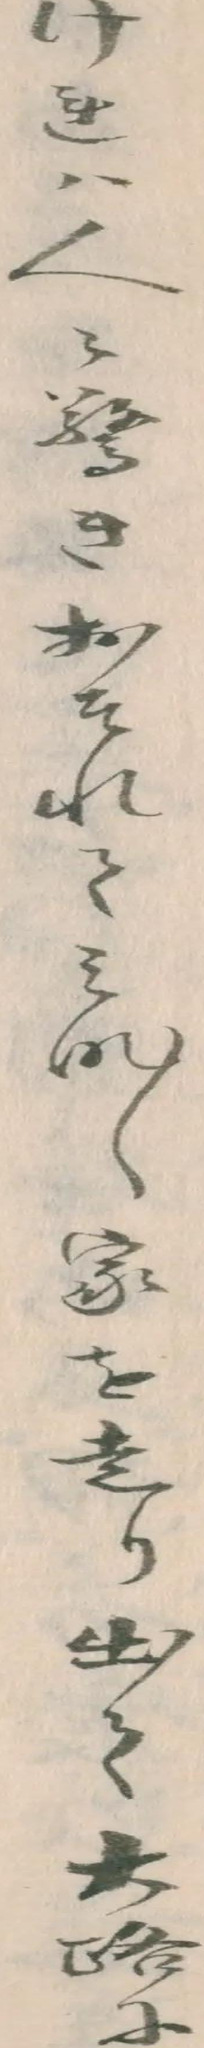ければ人々驚きおそれてみな〳〵家を走り出て大路に
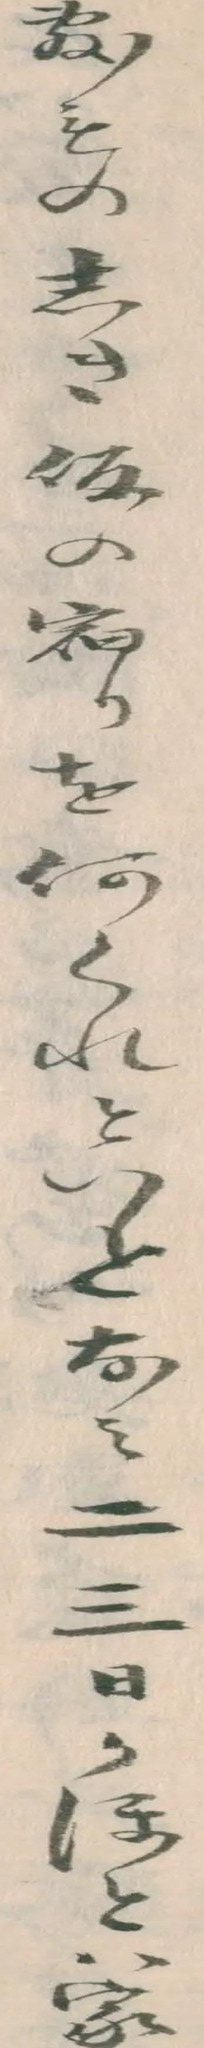敷ものしき仮の宿りを何くれといとなみ二三日かほどは家
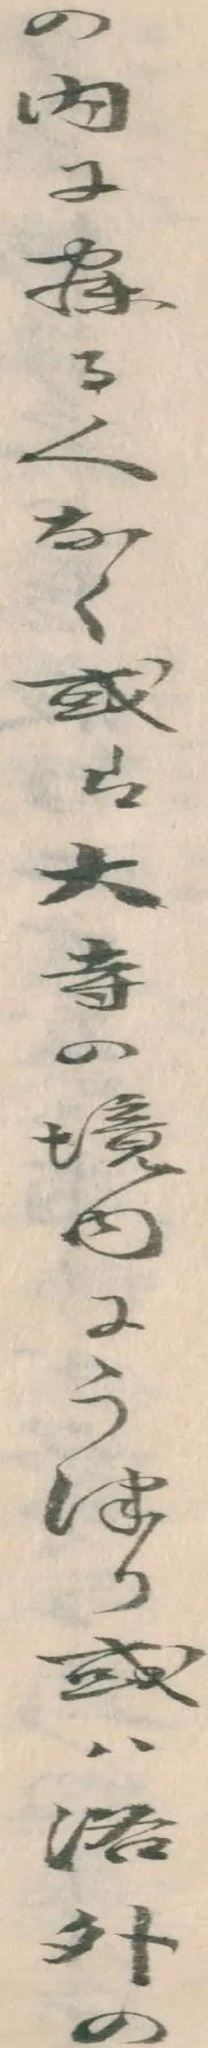の内に寝る人なく或は大寺の境内にうつり或は洛外の
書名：地災撮要. 巻11-12(地震之部)
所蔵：国立国会図書館 National Diet Library, JAPAN
